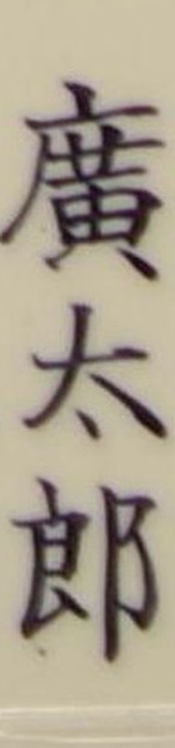廣太郎
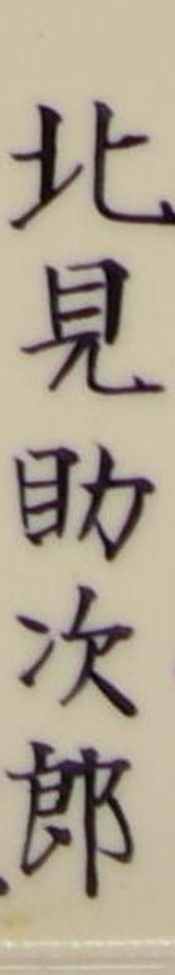北見助次郎
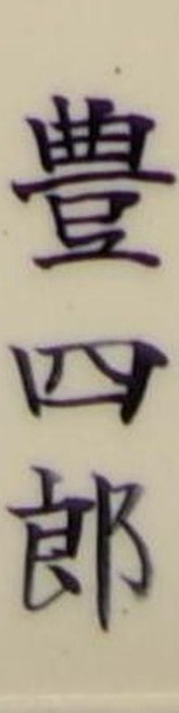豊四郎
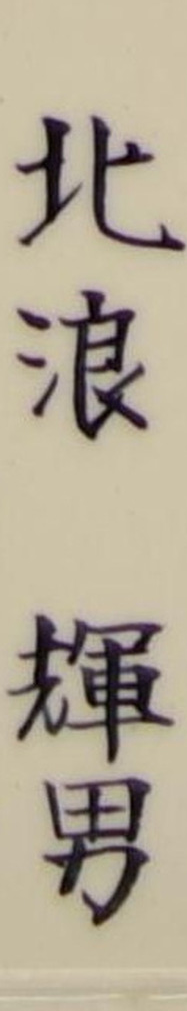北浪輝男
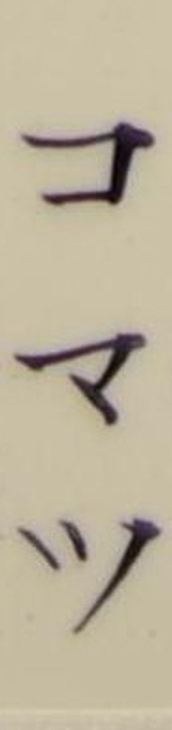コマツ
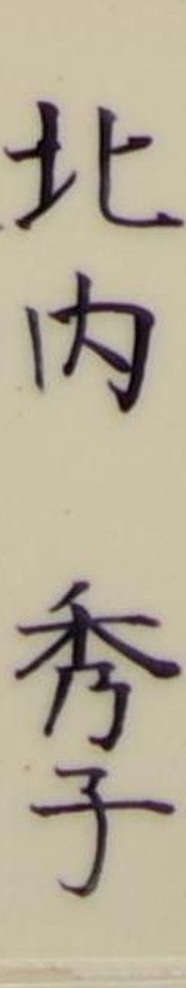北内秀子
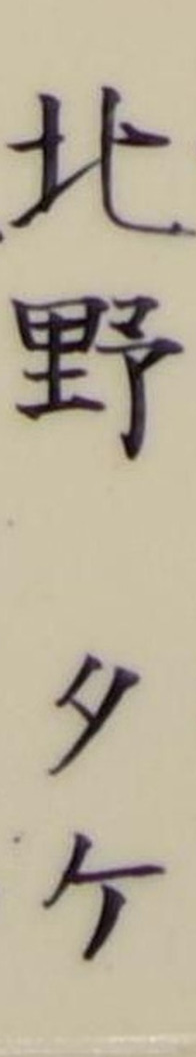北野夕ケ
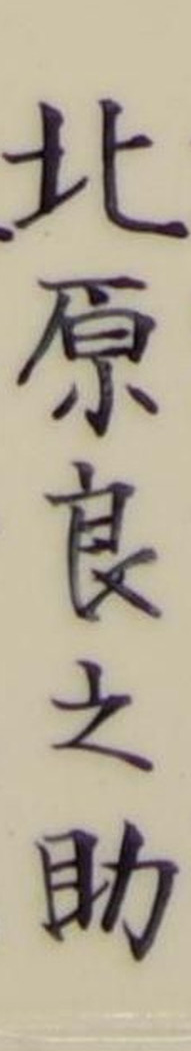北原良之助
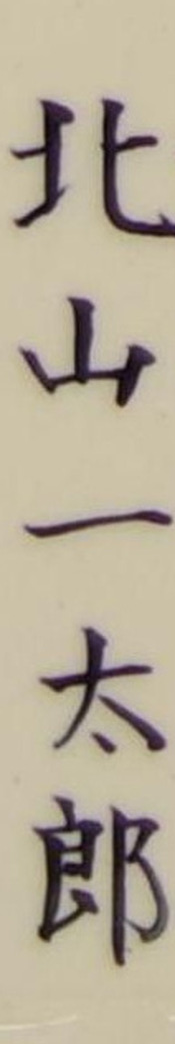北山一太郎
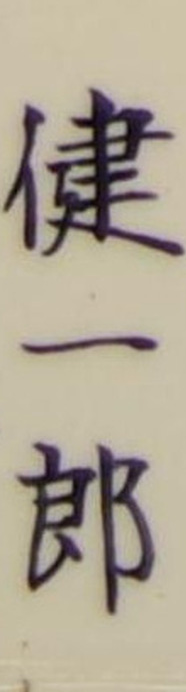健一郎

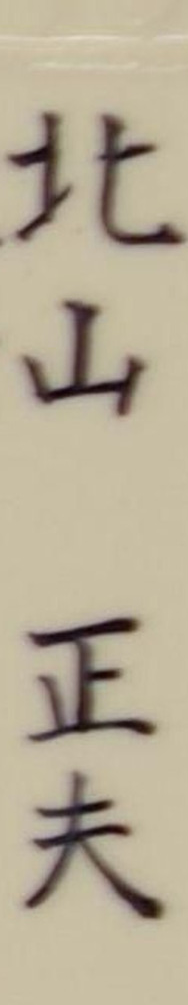北山正夫
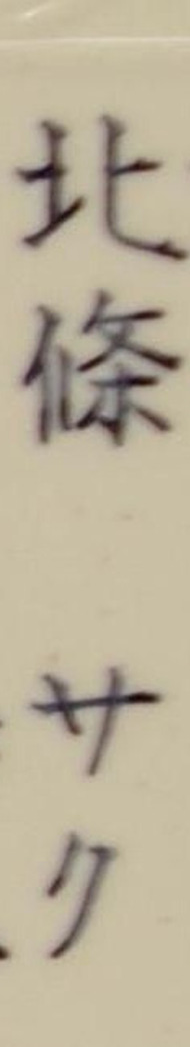北條サク
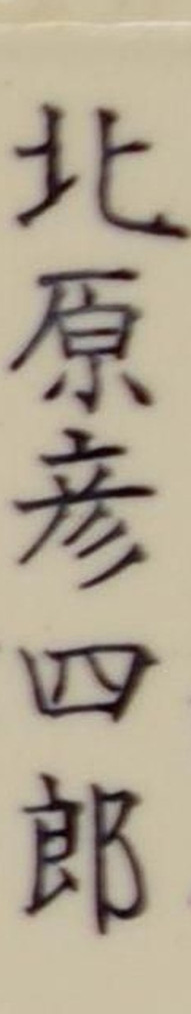北原彦四郎
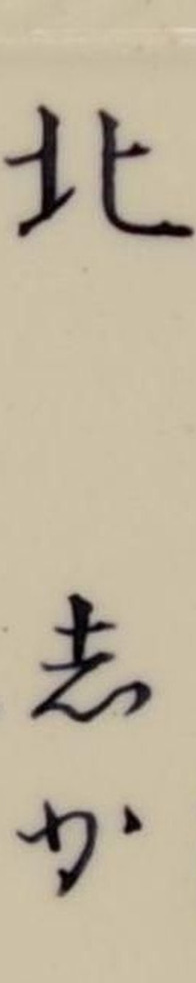北しか
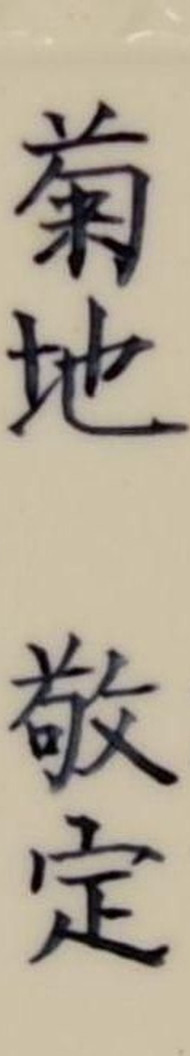菊地敬定
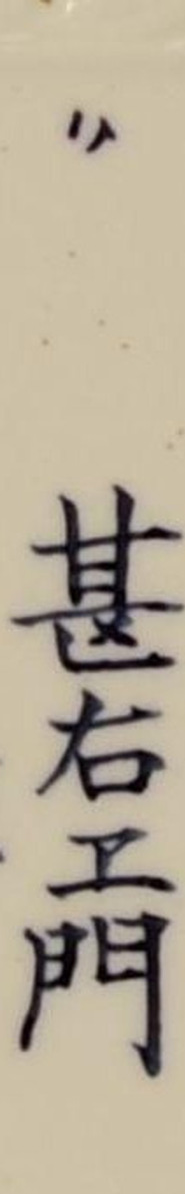甚右エ門
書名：E~L
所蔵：高野山金剛峯寺
